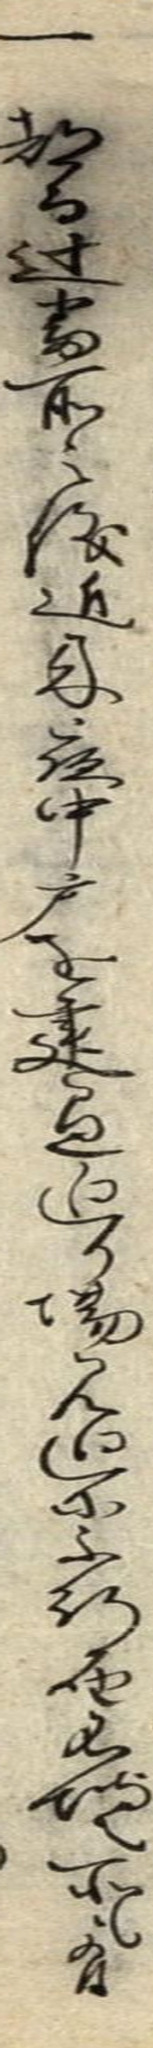都て辻番所之儀近来夜中戸を建置廻り場見廻等不行届不埒之所も有
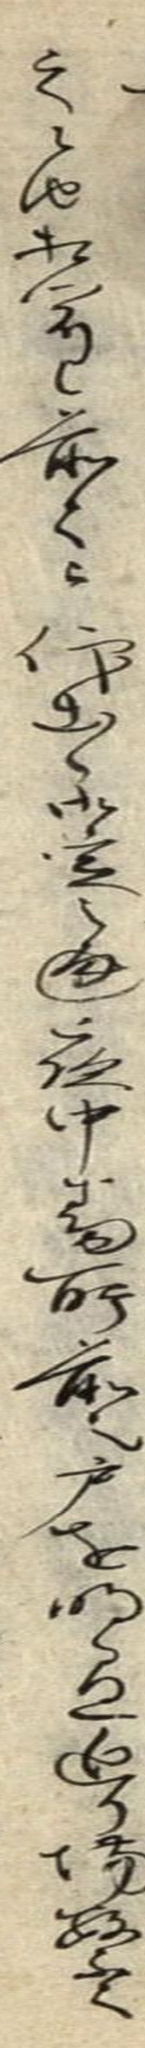之候由相聞候前々被仰出候御定之通夜中番所前之戸を明置廻り場繁々
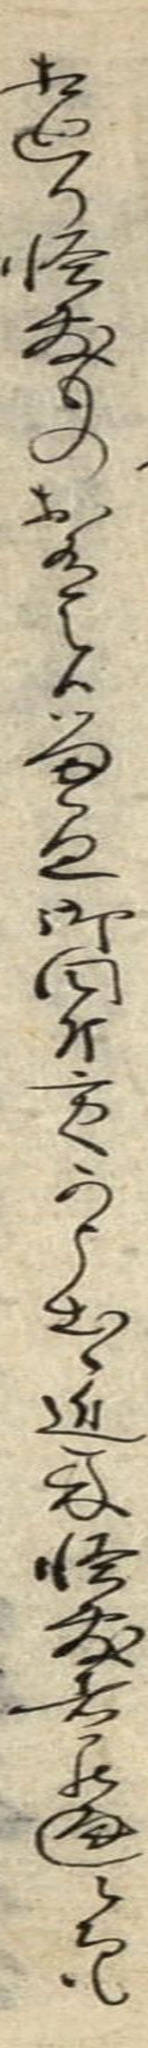相廻怪敷もの於有之は留置御目付方へ可申出候近来怪敷者罷通候ても
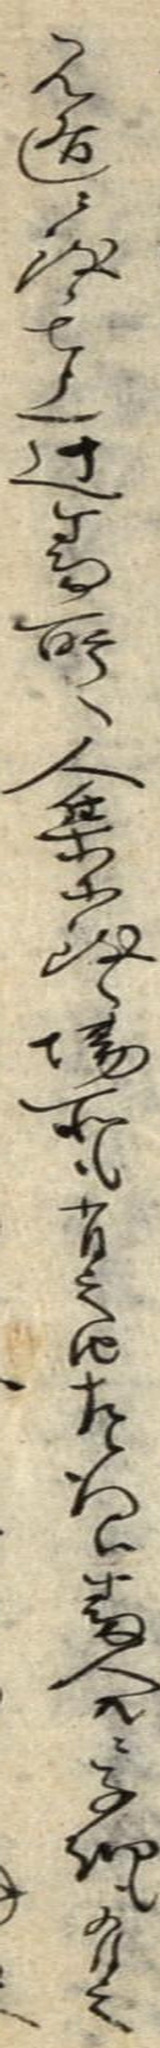見遁に致候其上辻番所へ人集等致候場所も有之由左候得は番人共に子細も有之
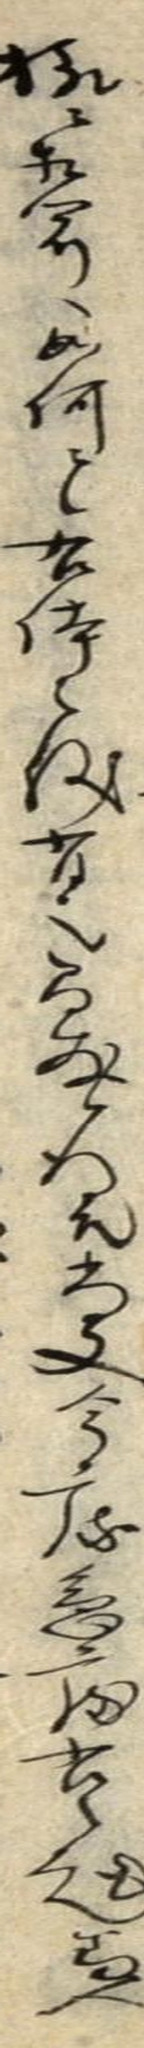様に相聞へ如何に候右体之儀有之間敷候得共尚又今度急度右之趣番人
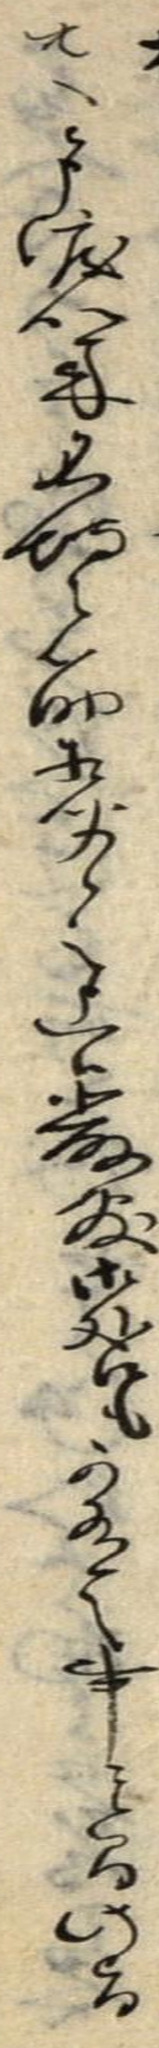共へ被申渡以来不埒之筋相聞候之上は厳敷御咎も可有之候事に候間此旨

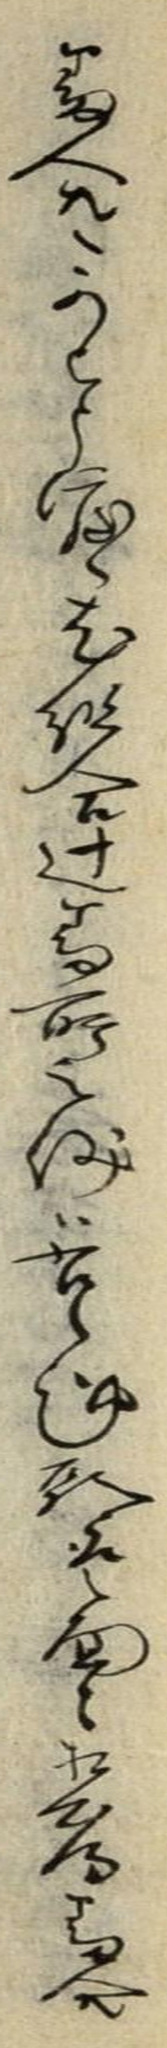番人共へ可被申渡候尤組合辻番所之儀は右之趣頭取之面々相心得番人共
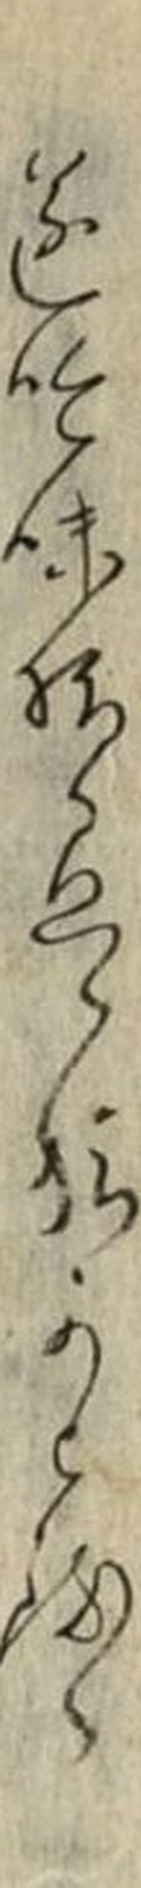遂吟味指置候様可被致候
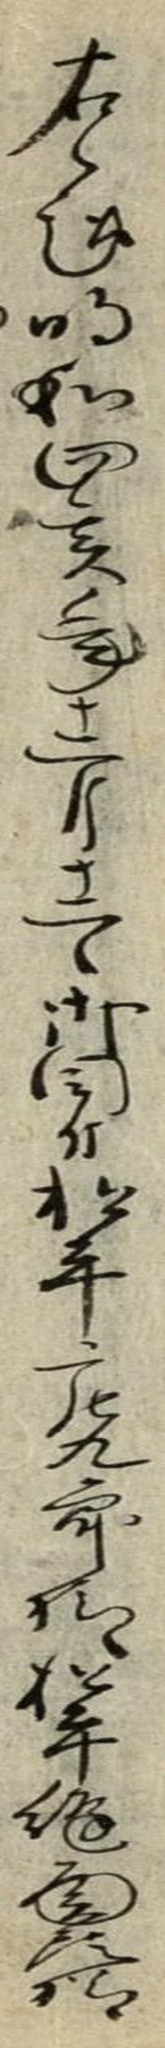右之趣明和四亥年十二月十二日御目付松平庄九郎様へ松平縫殿頭様
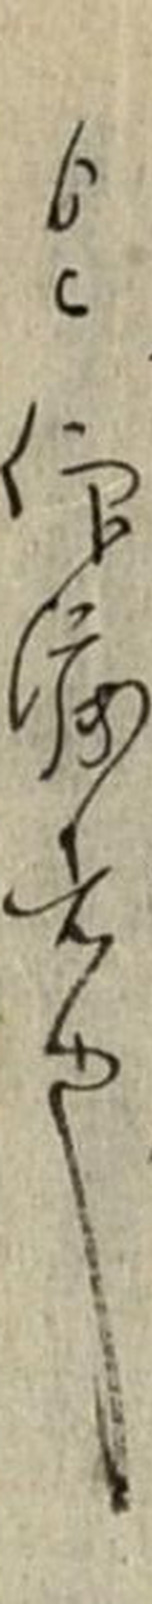ゟ被仰渡者也
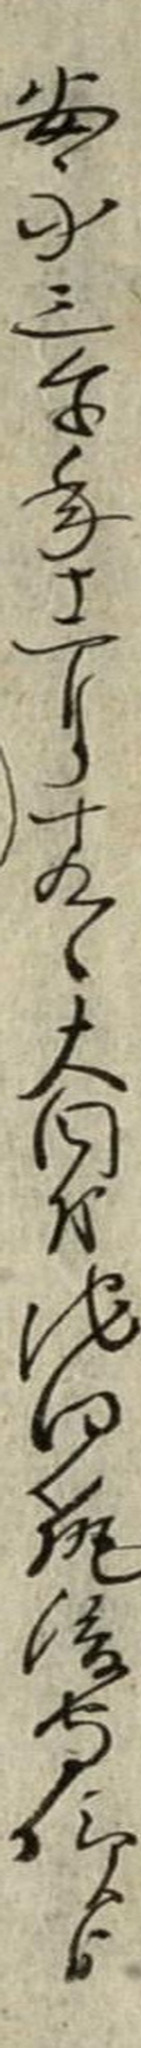安永三午年十二月十九日大目付池田筑後守様ゟ
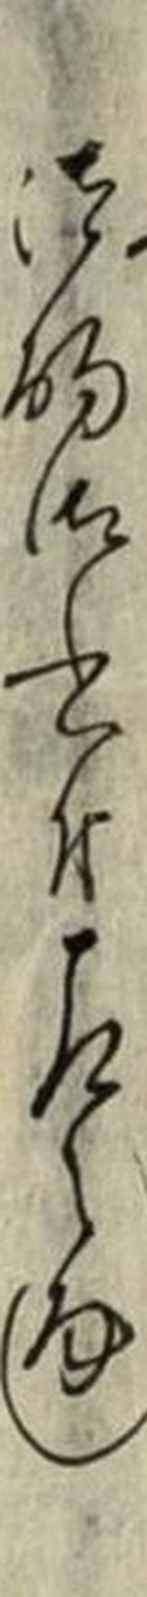御触御書付左之通
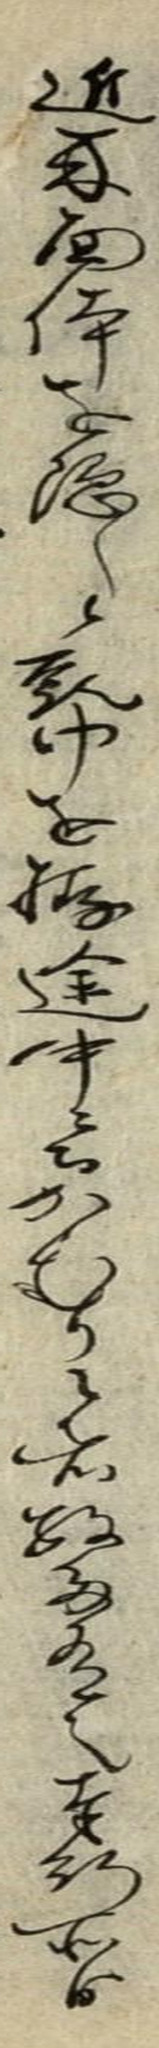一近来面体を隠し候頭巾を拵途中にてかむり候者数多有之奉行所ゟ
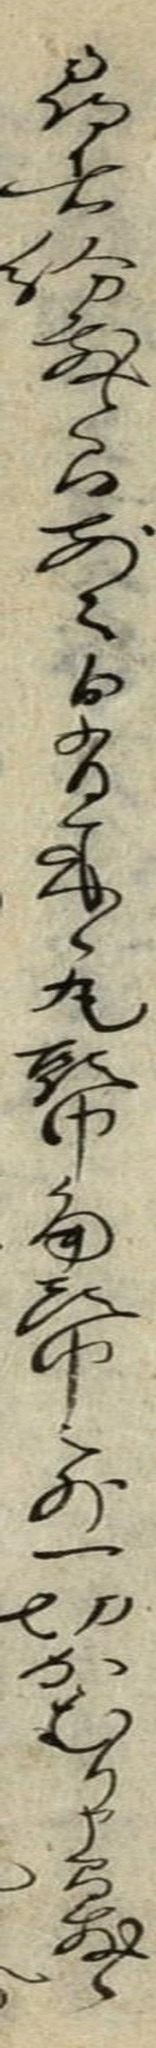尋者紛敷候間前々ゟ有来候丸頭巾角頭巾之外一切かむり申間敷候
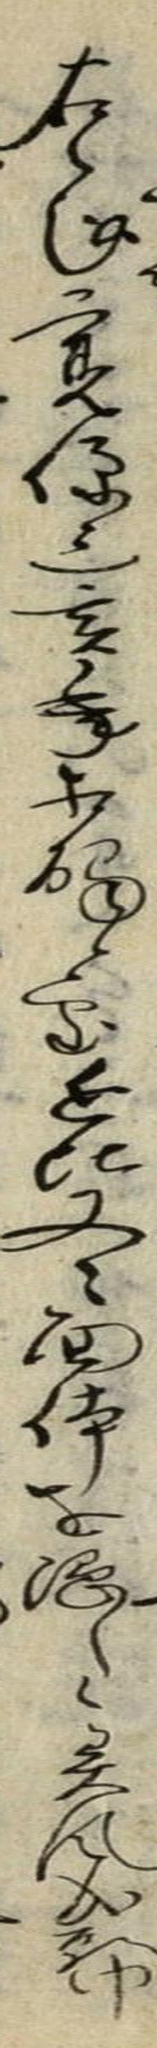右之趣寛保三亥年相触候処近頃又々面体を隠し候異風成頭巾
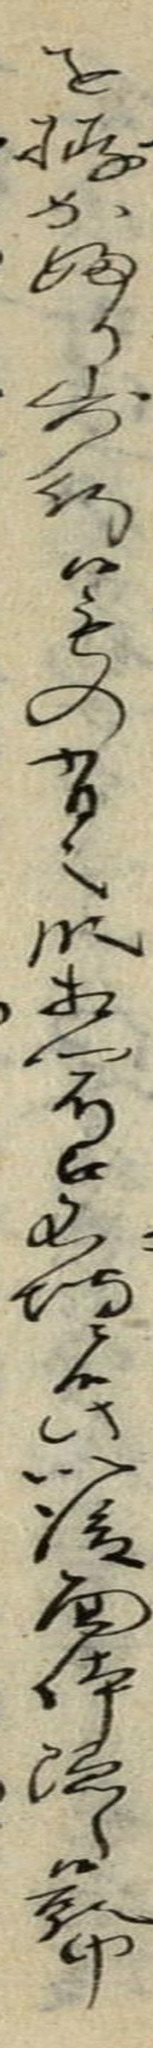を拵かふり歩行候もの有之段相聞江不埒に候此以後面体隠し候頭巾
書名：三都并道中之部
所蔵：福井県文書館 Fukui Prefectural Archives
